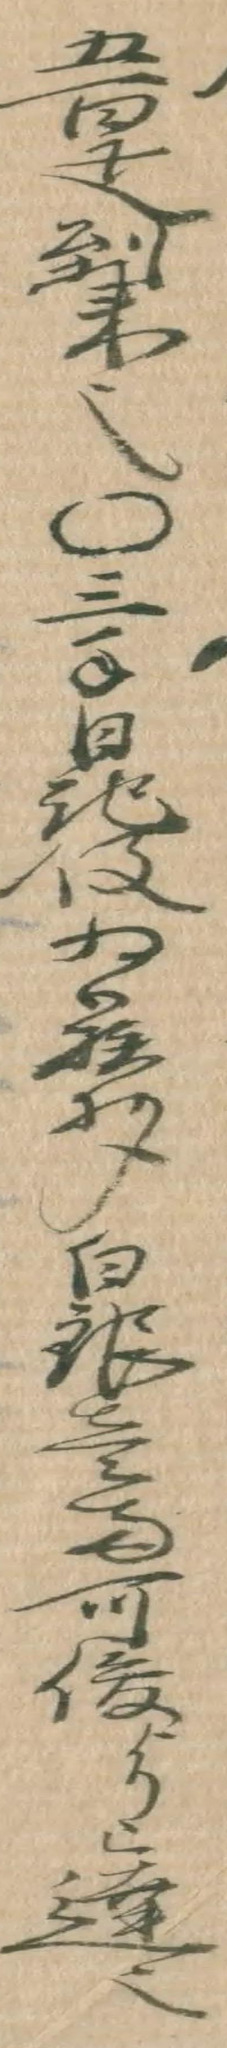五百疋到来也○三手日記役為御挨拶白銀壱両可俊より被達之
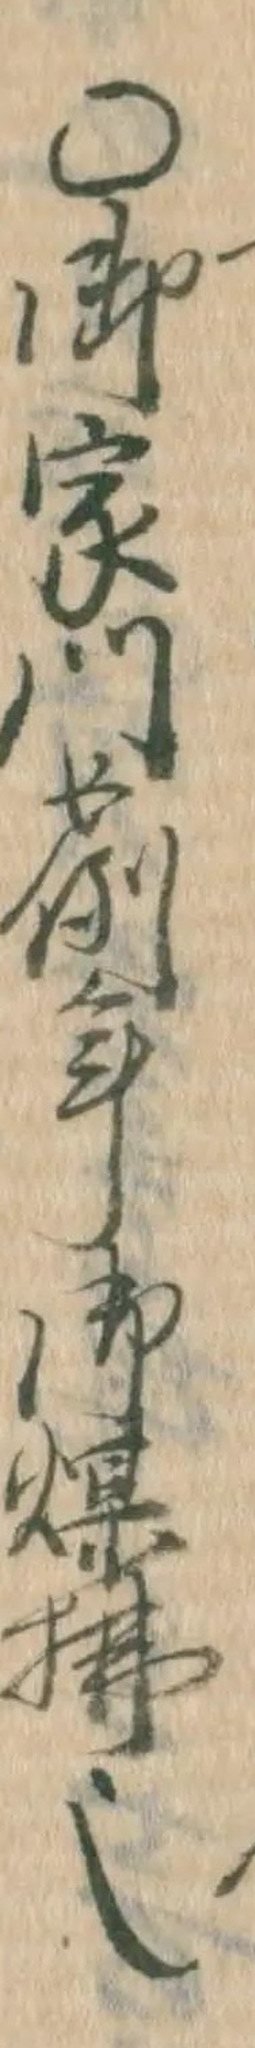○御家門如例年御煤払也
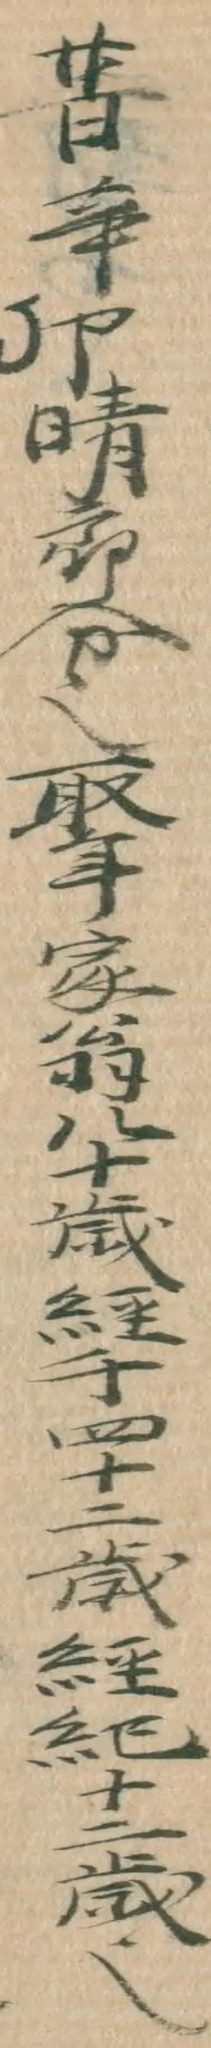廿日辛卯晴節分也取年家翁八十歳経千四十二歳経紀十二歳也
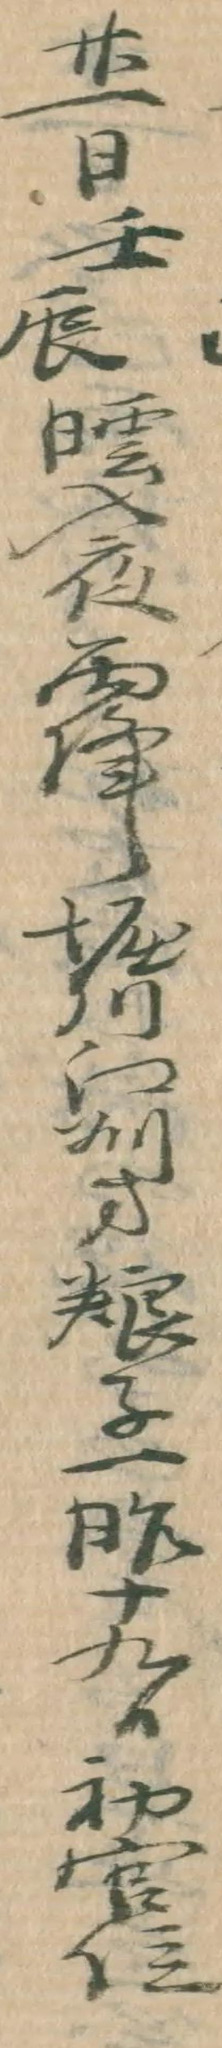廿一日壬辰曇入夜雨降堀川江州方養子一昨十九日初官位
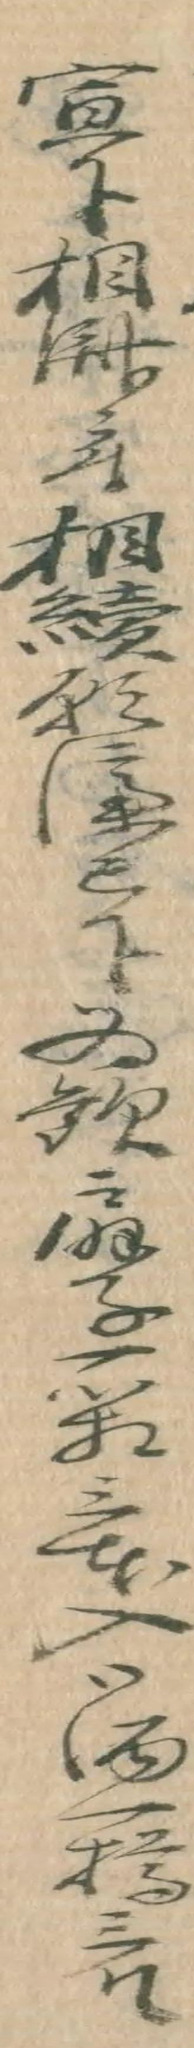宜下相済ニ付相續願済已下為歓扇子一箱三本入御酒一樽三斤

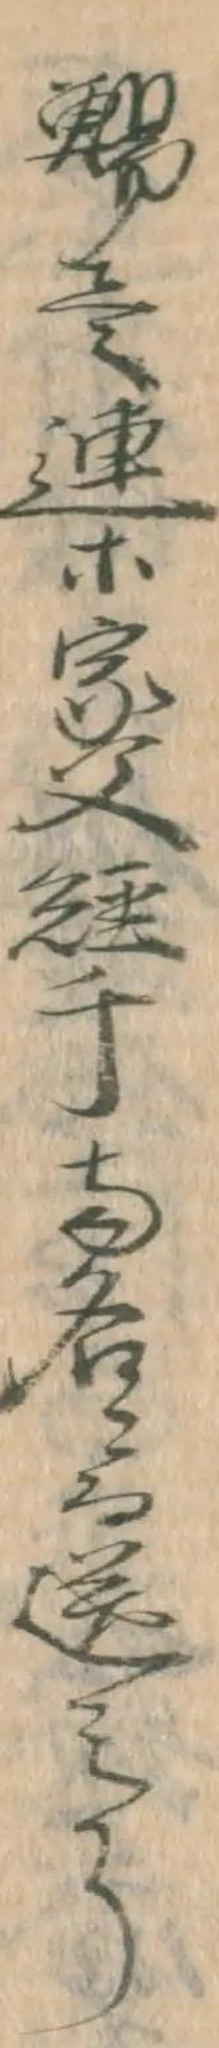鯣壱連等家父経千両名二而送之了
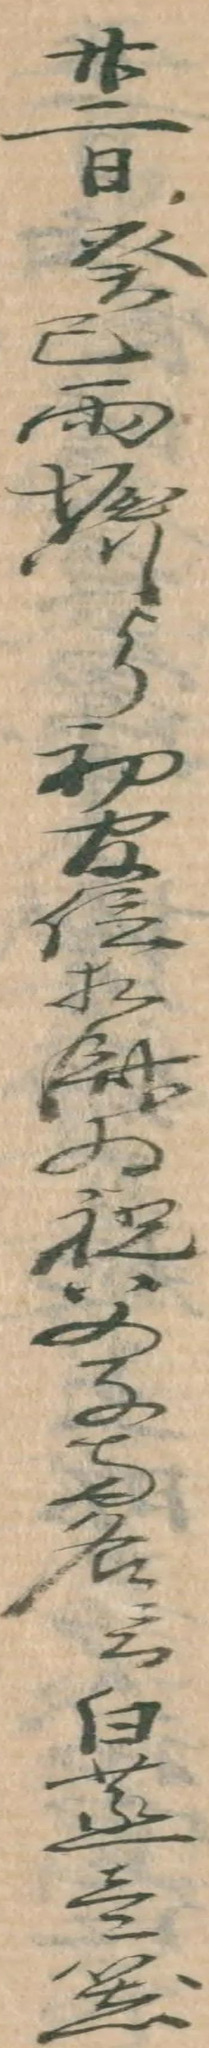廿二日癸巳雨堀川より初官位相済為祝父子両名ニ而白蒸壱器
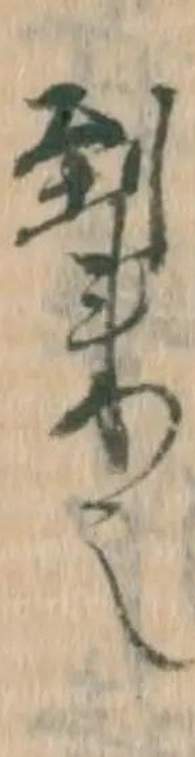到来也
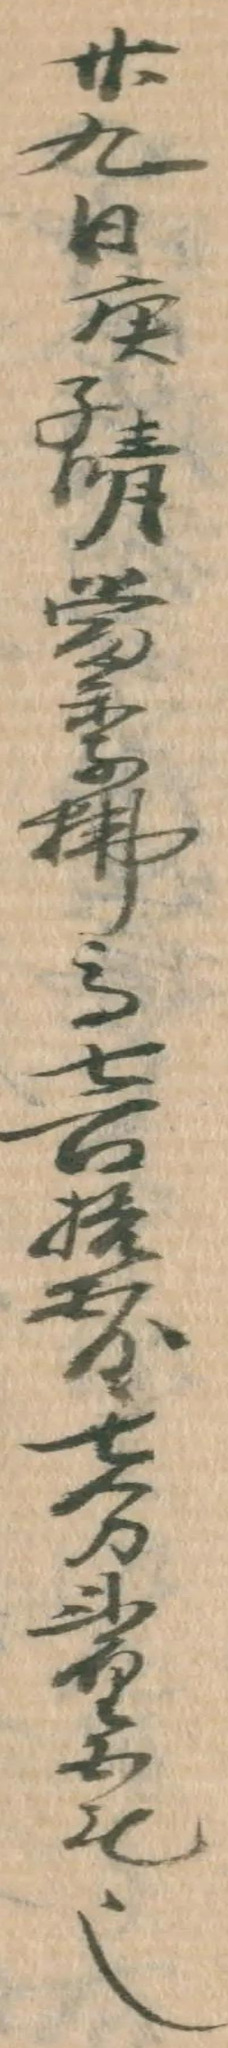廿九日庚子晴當季払高七百拾五匁七分弐厘五毛也

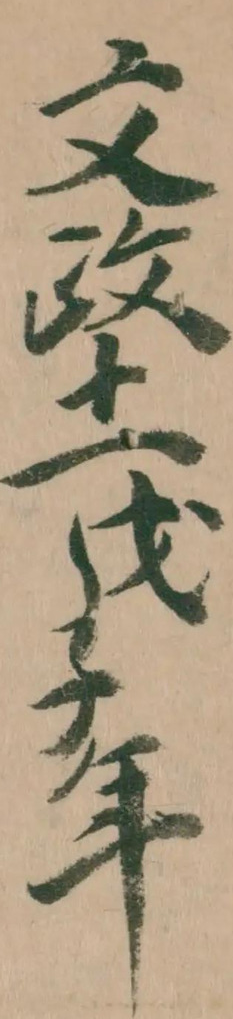文政十一戊子年
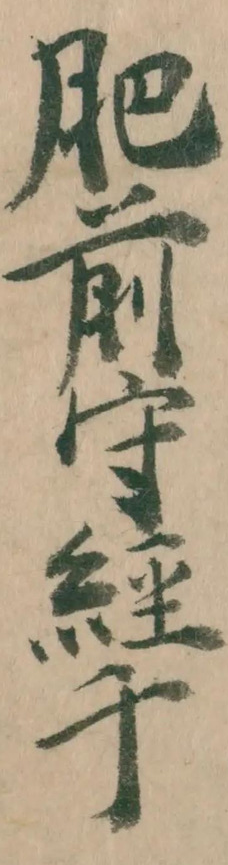肥前守経千

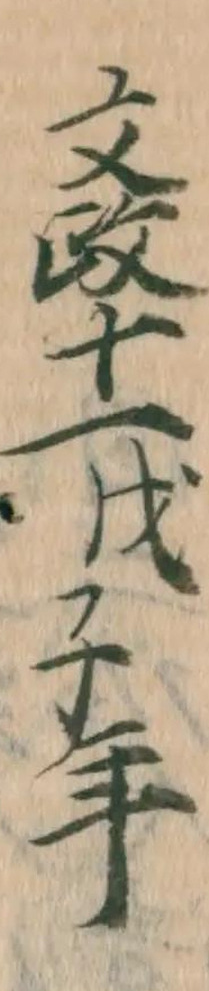文政十一戊子年
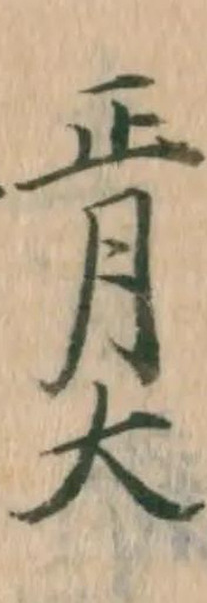正月大
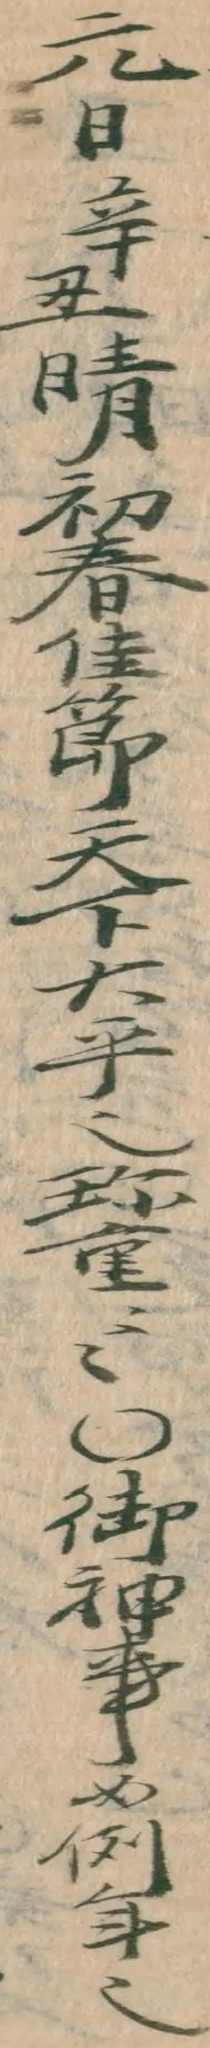元日辛丑晴初春佳節天下大平也珍重々々〇御神事如例年也
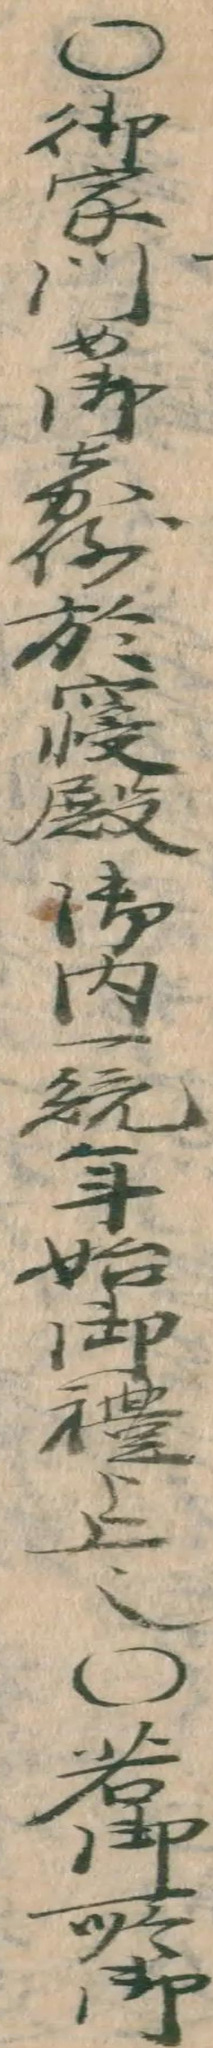○御家門如御嘉例於寝殿御内一統年始御禮申上也○若御所御
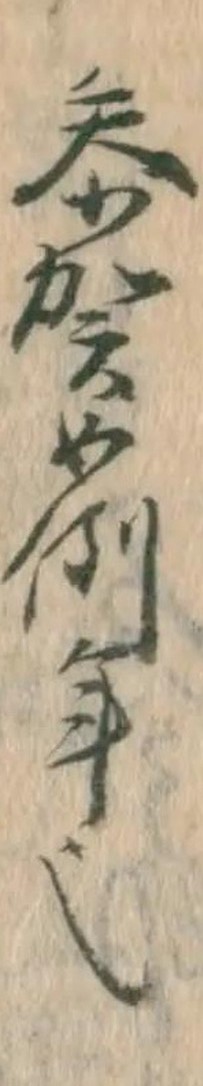参賀如例年也
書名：賀茂社記録. 第65冊
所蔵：国立国会図書館 National Diet Library, JAPAN
